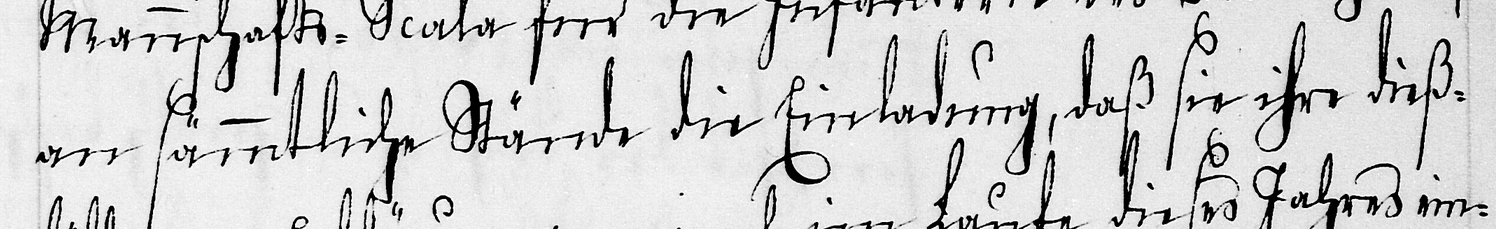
an sämmtliche Stände die Einladung, daß sie ihre dieß¬
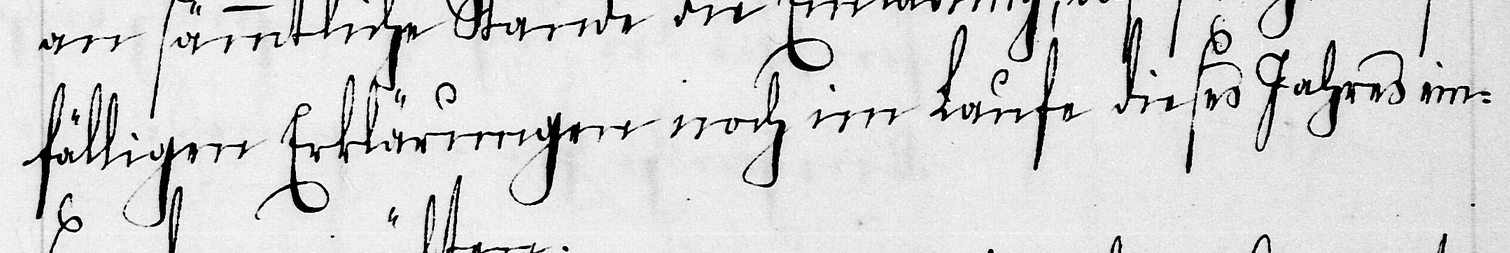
fälligen Erklärungen noch im Laufe dieses Jahres ein¬
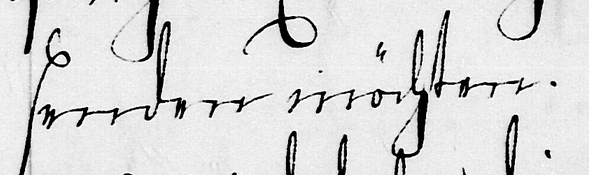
senden möchten.
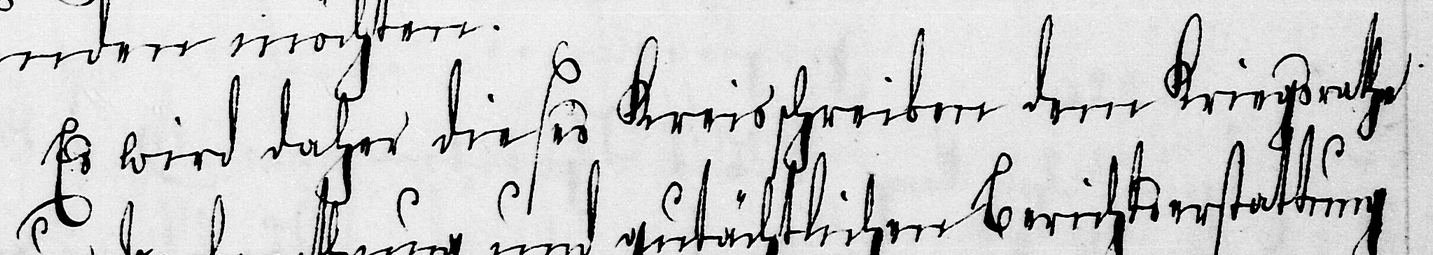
Es wird daher dieses Kreisschreiben dem Kriegsrathe
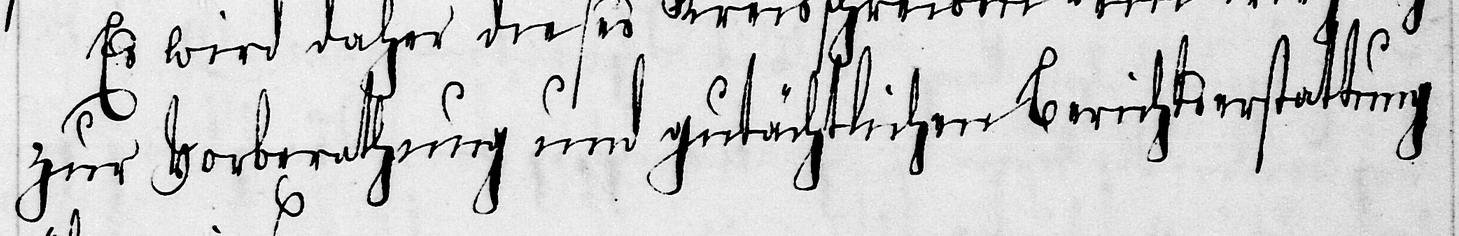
zur Vorberathung und gutächtlichen Berichtserstattung
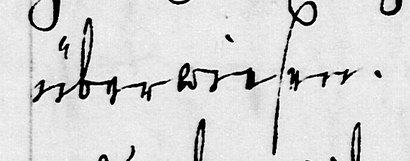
überwiesen.
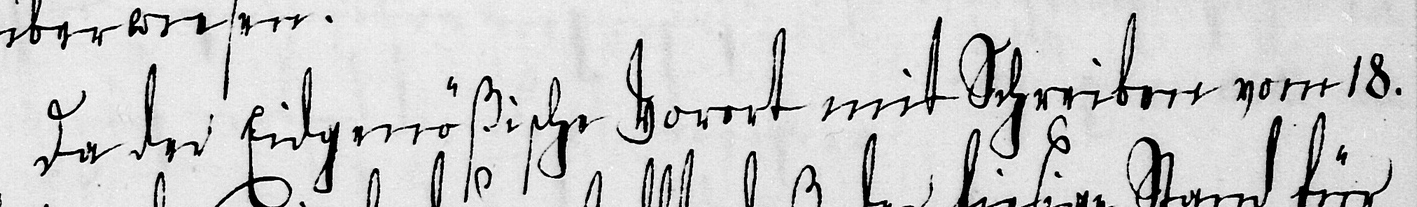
Da der Eidgenößische Vorort mit Schreiben vom 18.
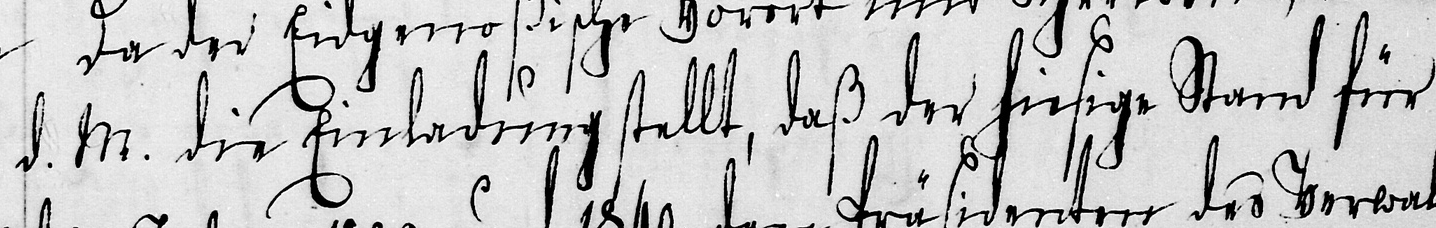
d. M. die Einladung stellt, daß der hiesige Stand für
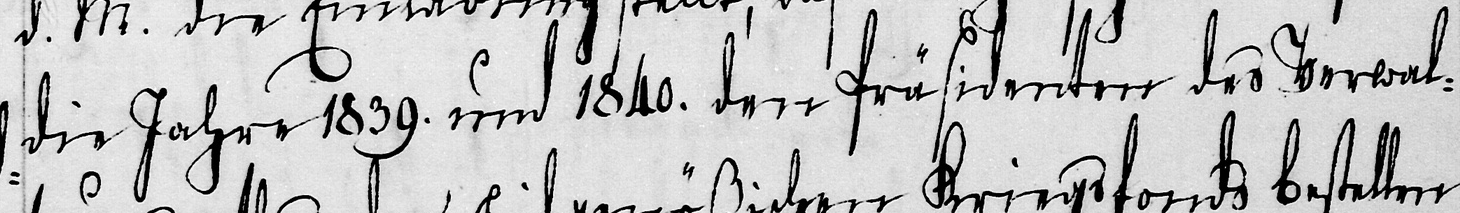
die Jahre 1839. und 1840. den Präsidenten des Verwal¬
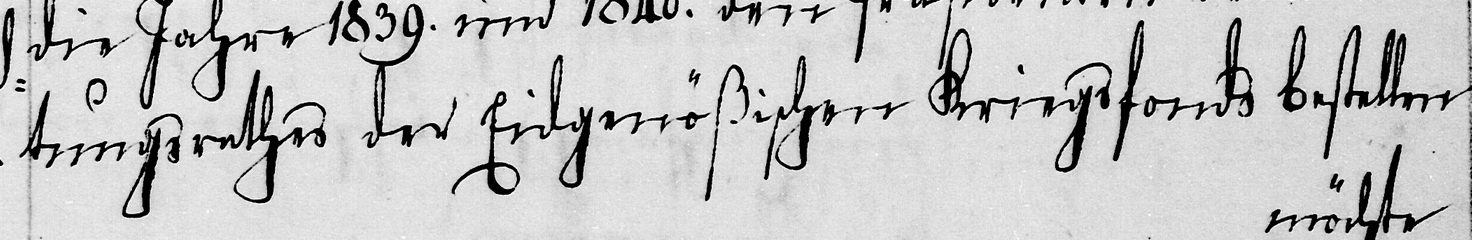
tungsrathes der Eidgenößischen Kriegsfonds bestellen
